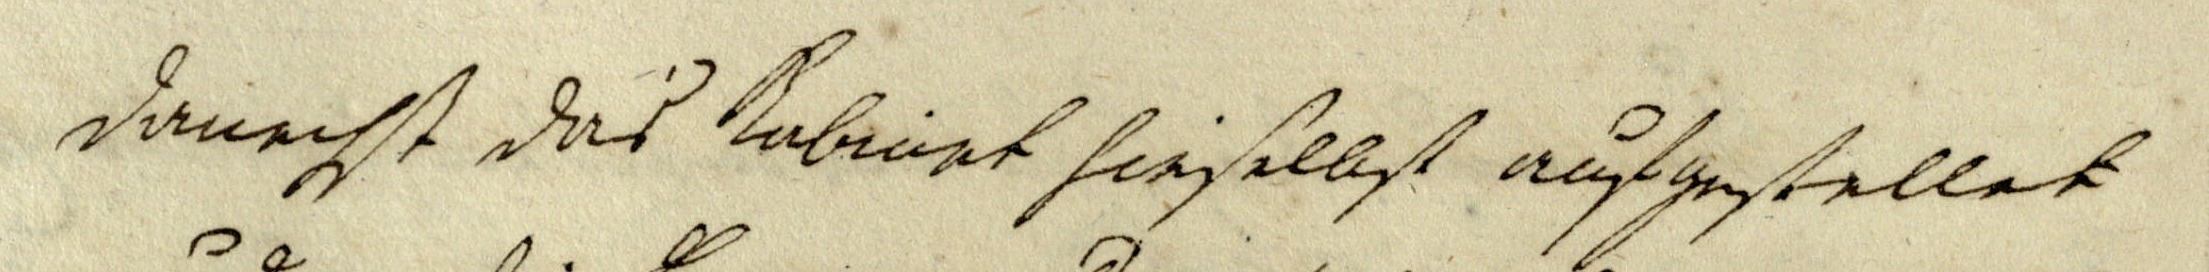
danechst das Cabinet hieselbst aufgestellet
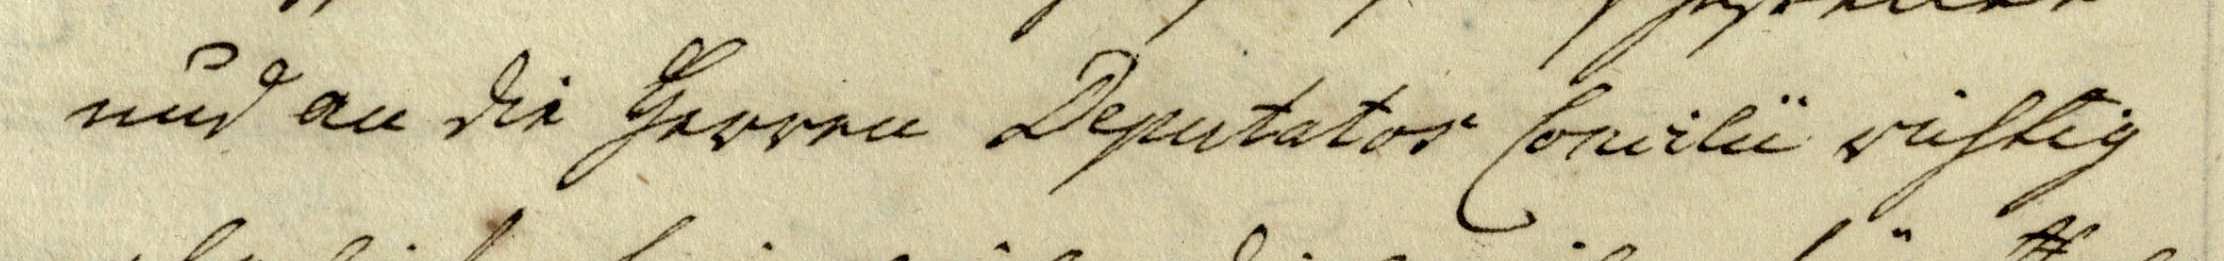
und an die Herren Deputatos Concilii richtig
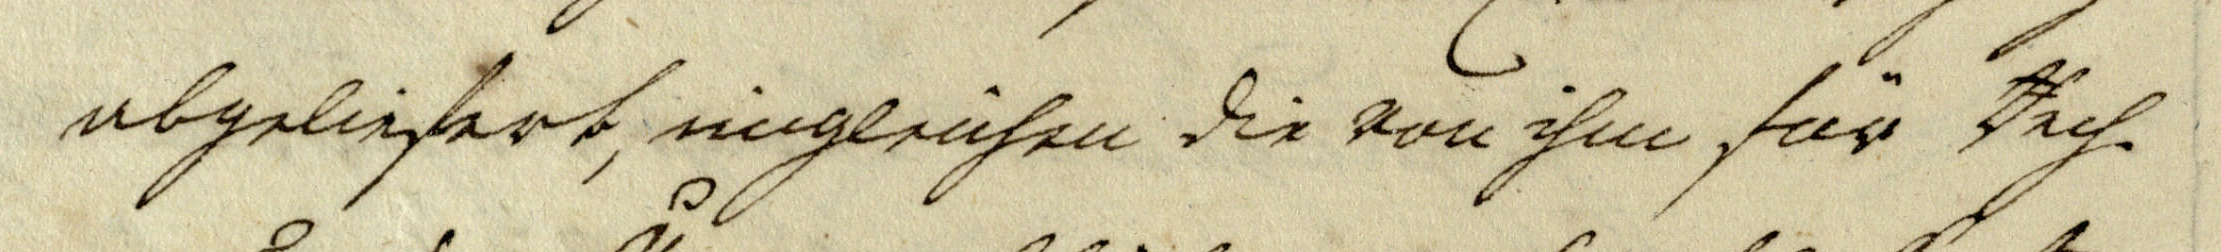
abgeliefert, imgleichen die von ihm für Rech¬
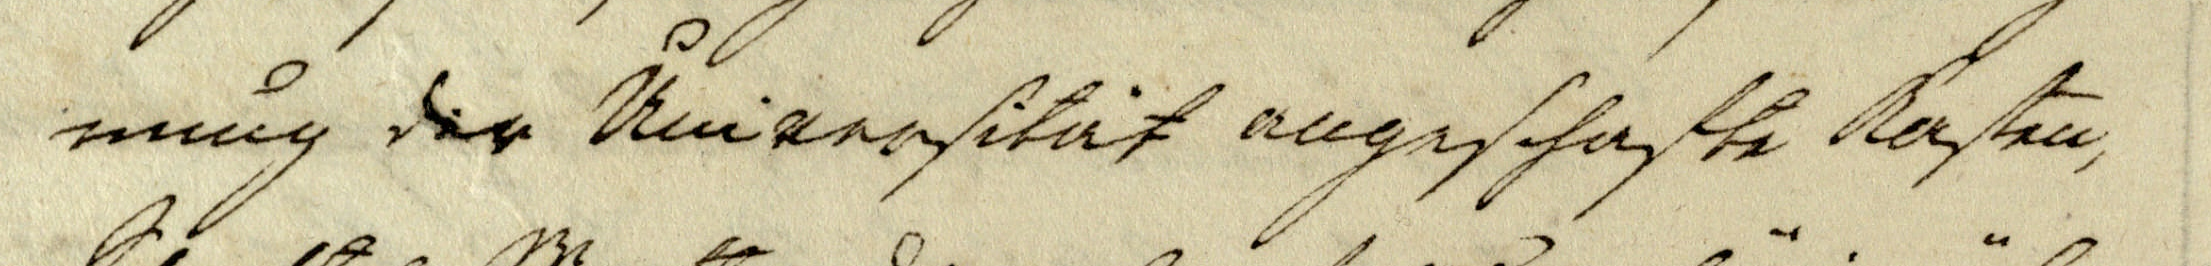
nung der Universität angeschafte Kasten,
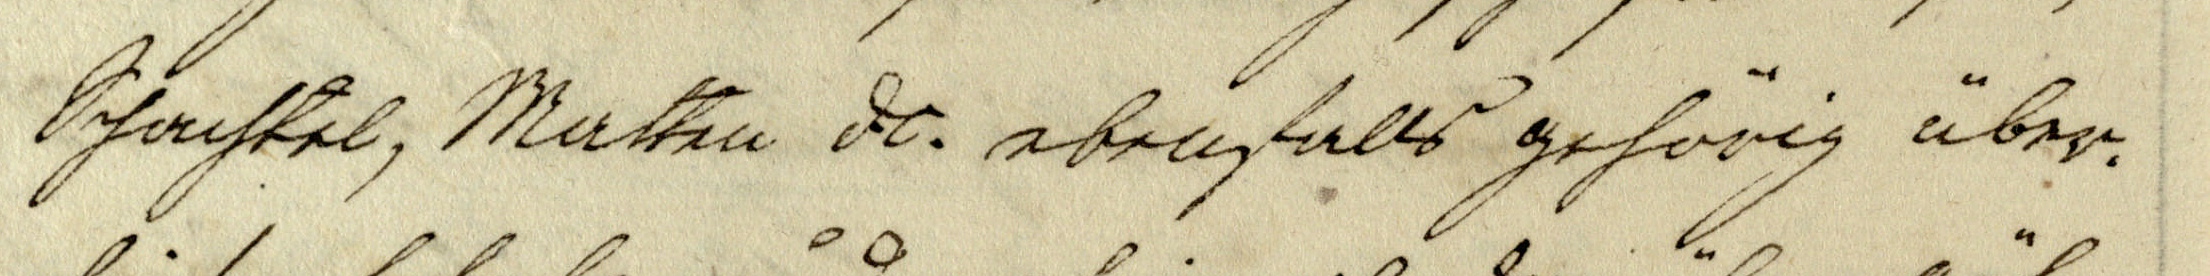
Schachtel, Matten d.c. ebenfalls gehörig über¬
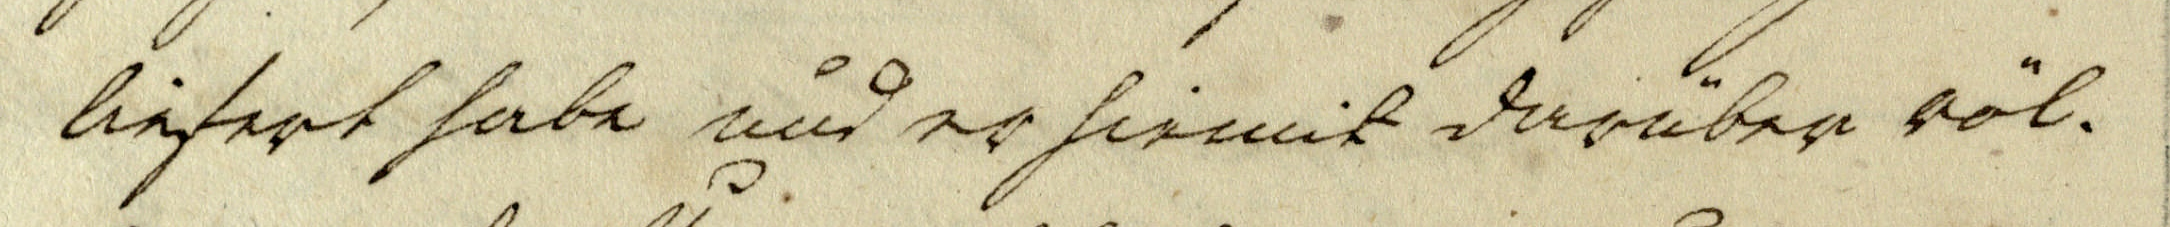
liefert habe und er hiemit darüber völ¬
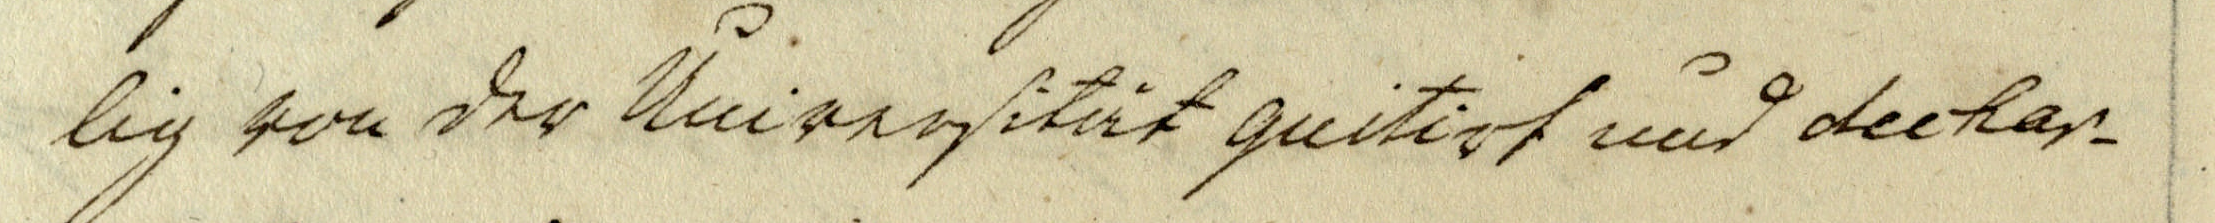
lig von der Universität quitirt und dechar¬
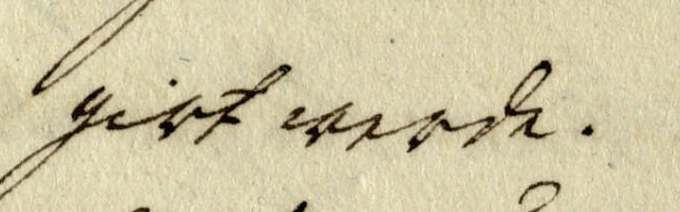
girt werde.
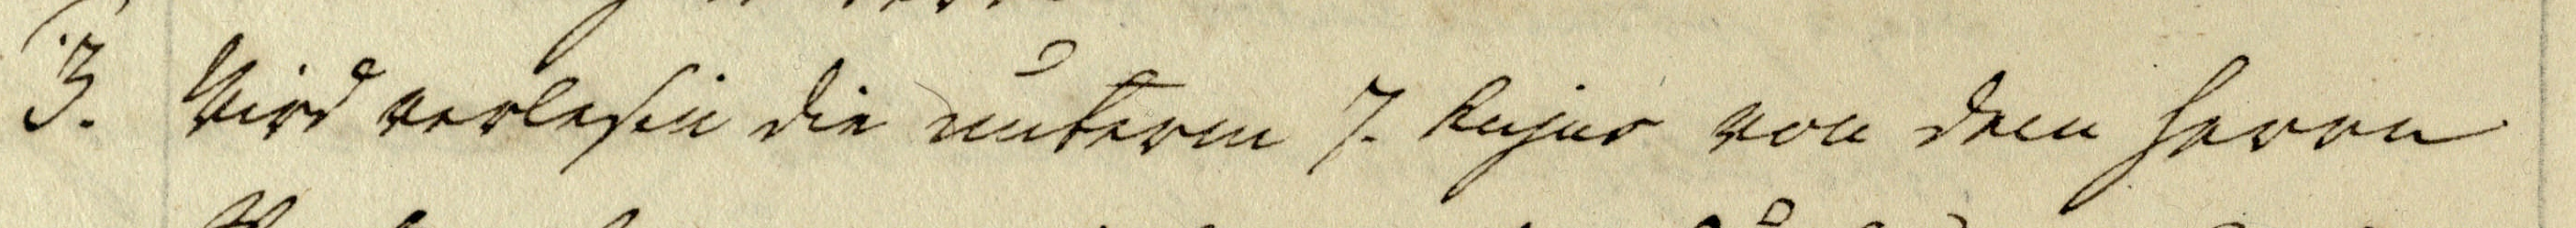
3. Wird verlesen die unterm 7. hujus von dem Herrn
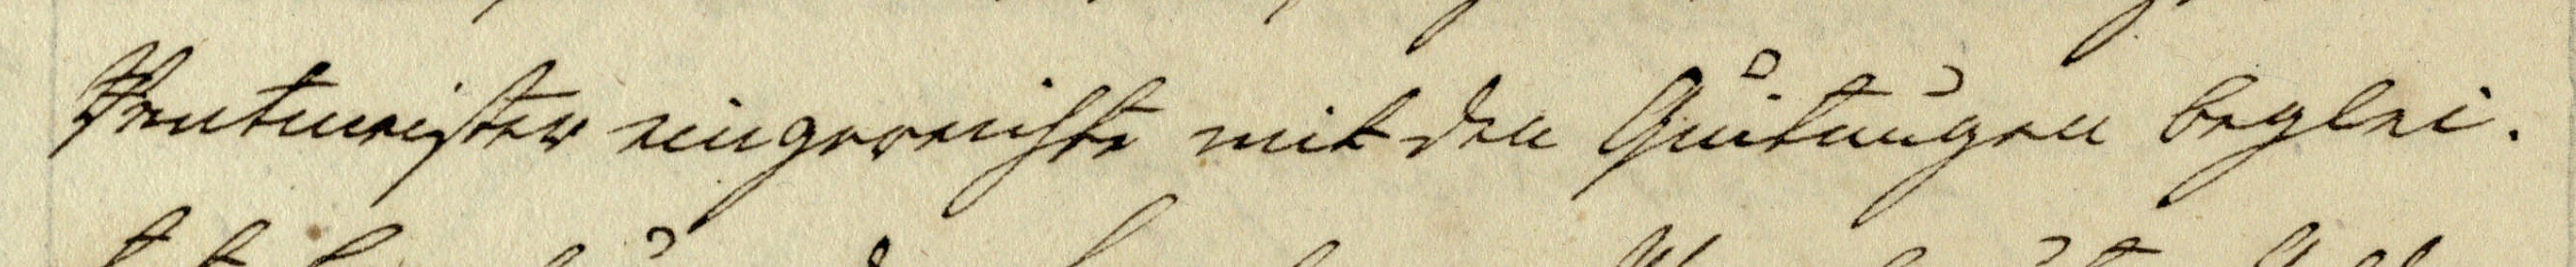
Rentmeister eingereichte mit den Quitungen beglei¬
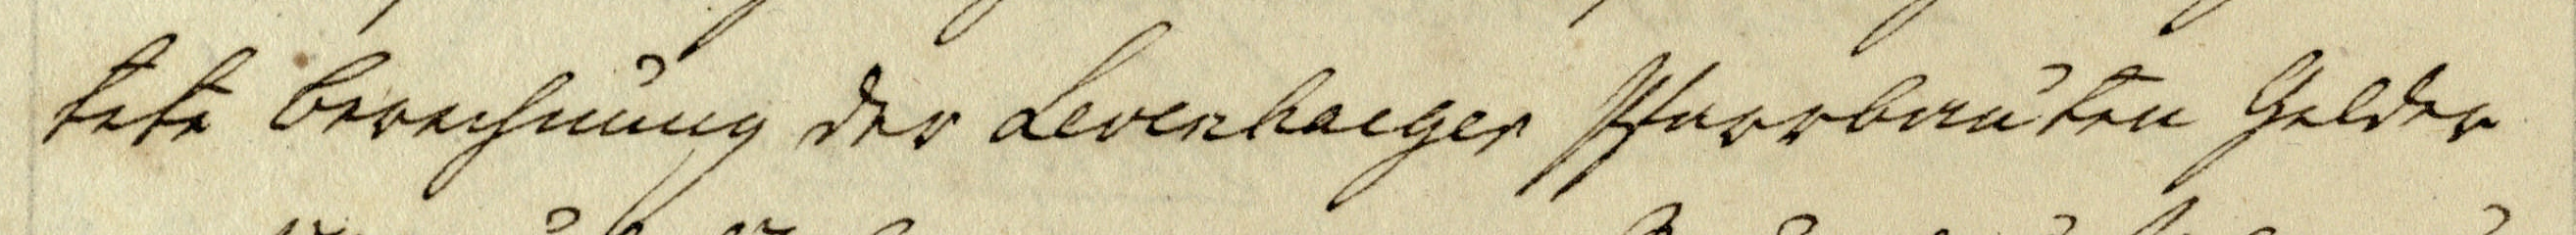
tete Berechnung der Levenhaeger Pfarrbauten Gelder
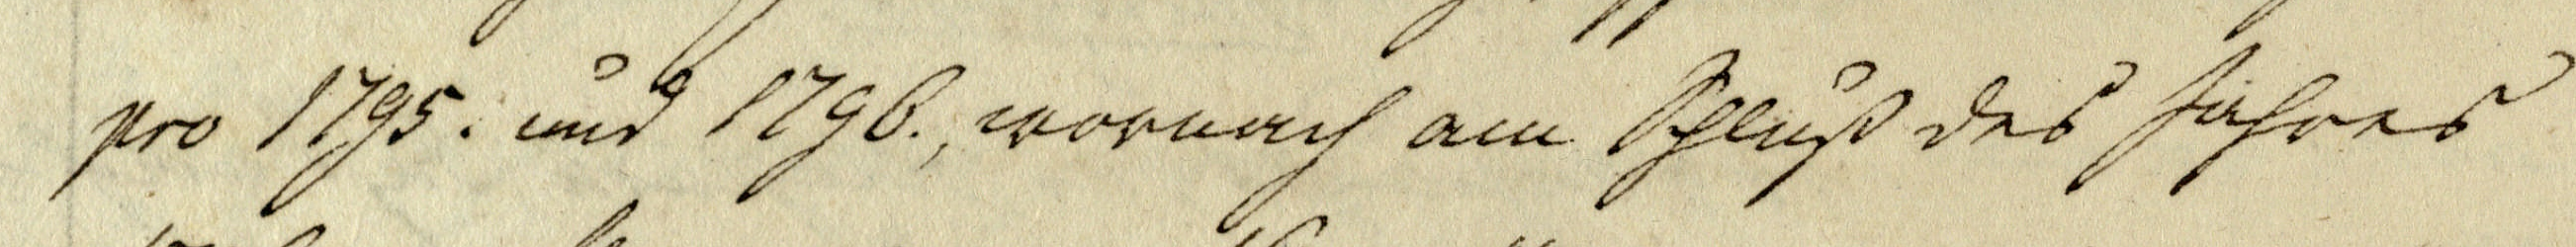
pro 1795. und 1796., wornach am Schluß des Jahres
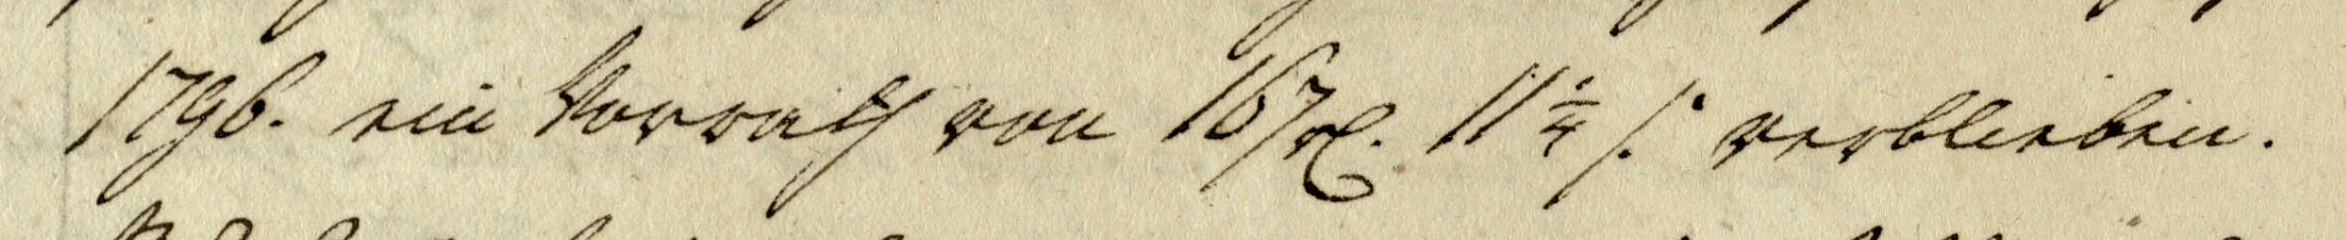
1796. ein Vorrath von 167 rl. 11¼ s. verblieben.
